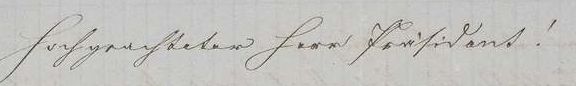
Hochgeachteter Herr Präsident!
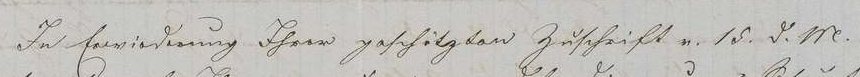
In Erwiederung Ihrer geschätzten Zuschrift v. 15. d. M.
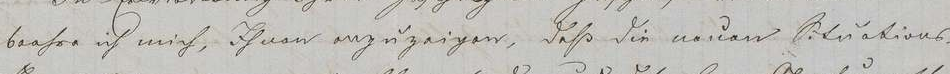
beehre ich mich, Ihnen anzuzeigen, daß die neuen Situations-
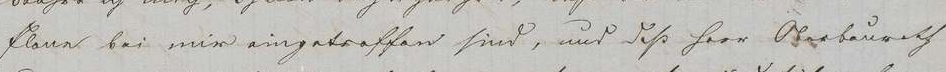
Plane bei mir eingetroffen sind, und daß Herr Oberbaurath
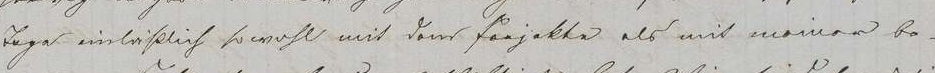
Tage einläßlich sowohl mit dem Projekte als mit meiner be-
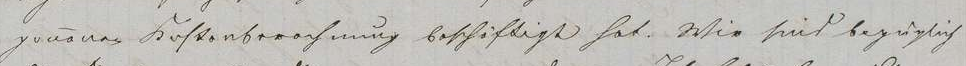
gonnenen Kostenberechnung beschäftigt hat. Wir sind bezüglich
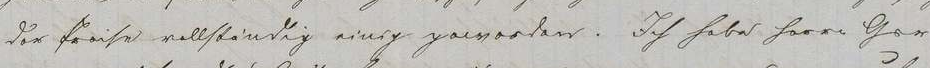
der Preise vollständig einig geworden. Ich habe Herrn Ger-
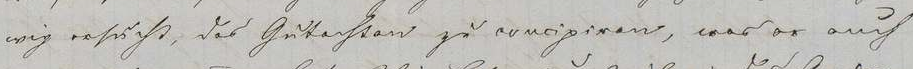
wig ersucht, das Gutachten zu corrigiren, was er auch
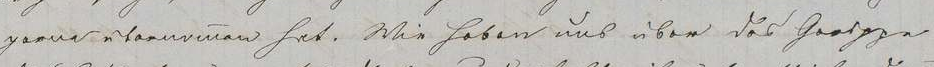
gerne übernommen hat. Wir haben uns über das Gerippe
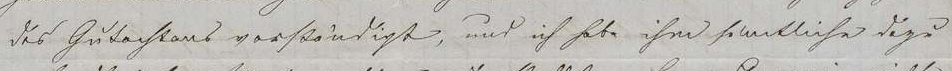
des Gutachtens verständigt, und ich habe ihm sämtliche dazu
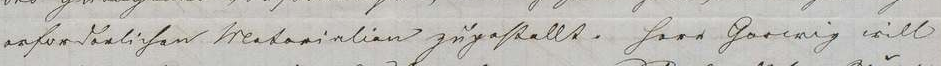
erforderlichen Materialien zugestellt. Herr Gerwig will
